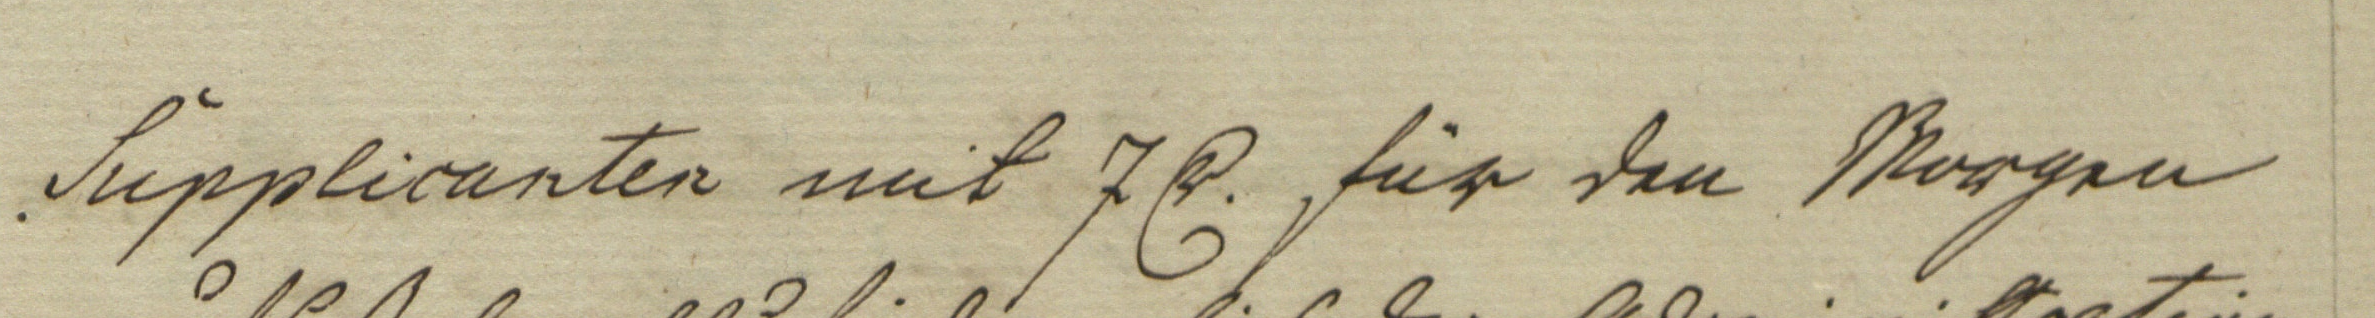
Supplicanten mit 7 l. für den Morgen
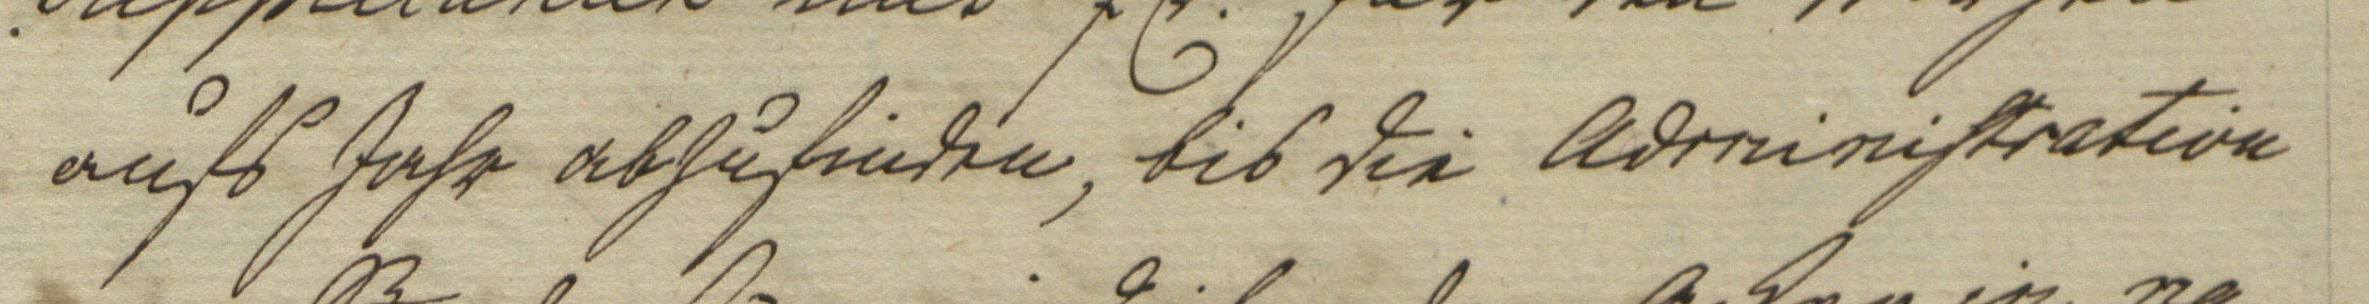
aufs Jahr abzufinden, bis die Administration
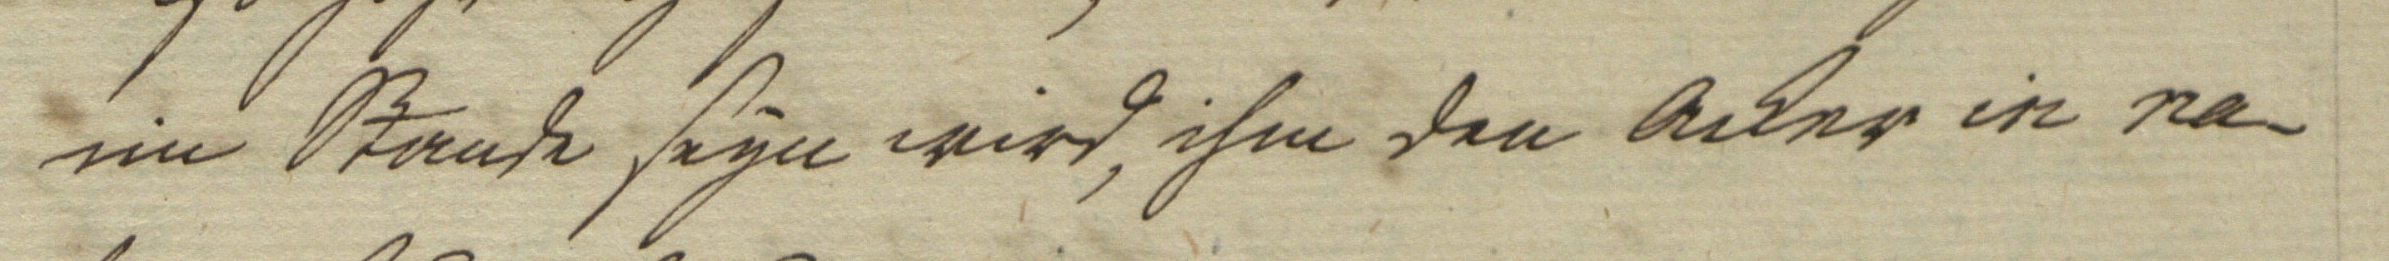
im Stande seÿn wird, ihm den Acker in na¬
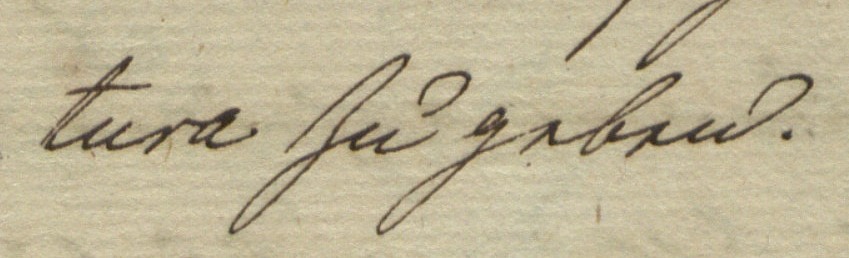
tura zu geben.
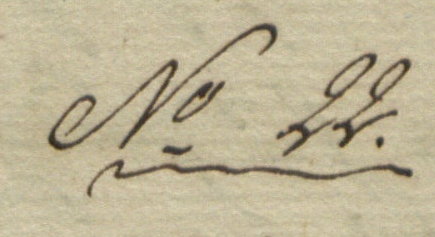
No 22.
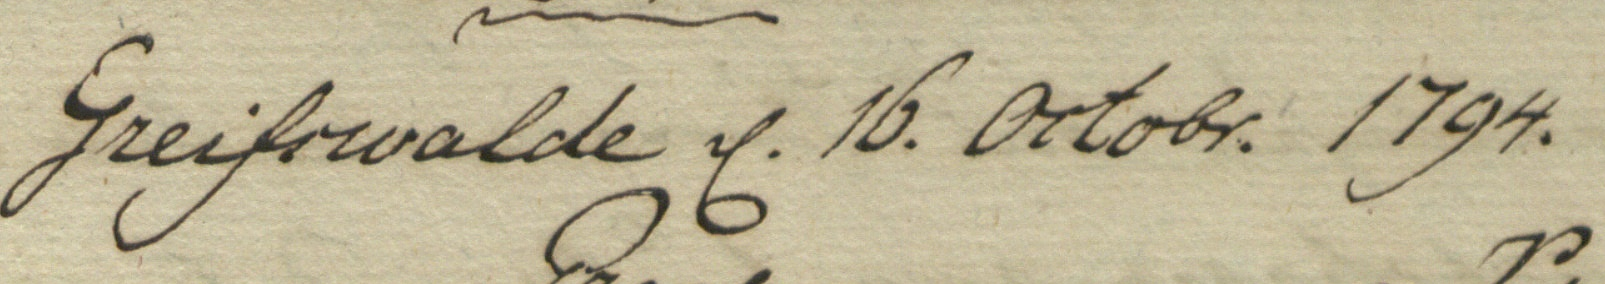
Greifswalde d. 16. Octobr. 1794.
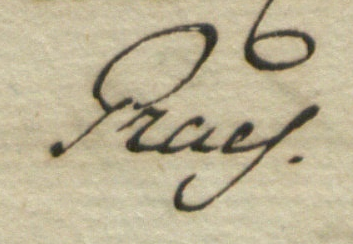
Praes.
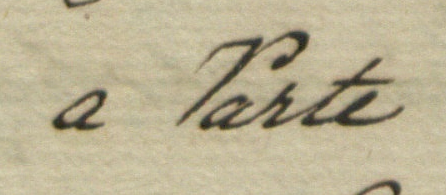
a Parte
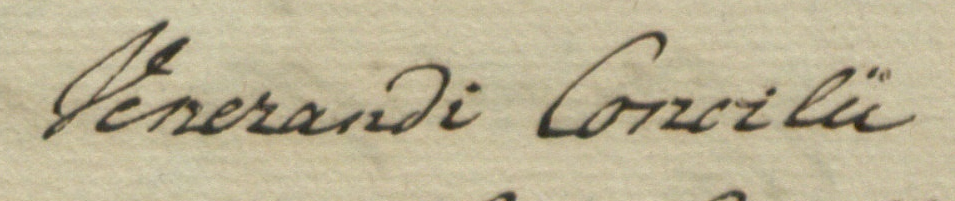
Venerandi Concilii
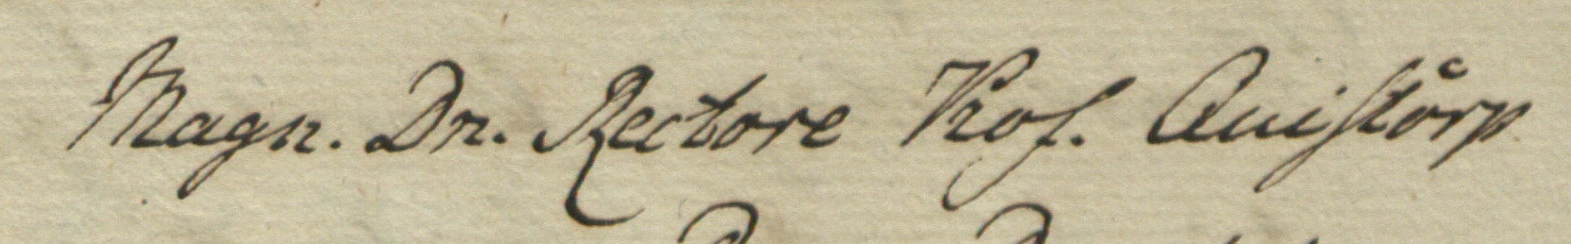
Magn. Dn. Rectore Prof. Quistorp.
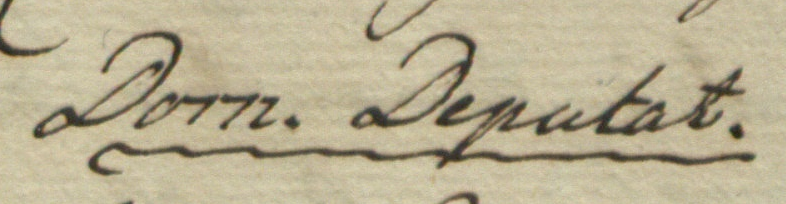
Dom. Deputat.
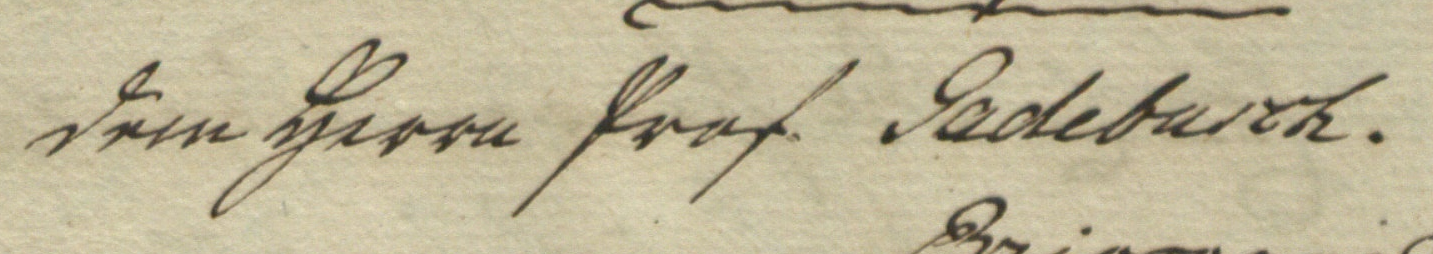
dem Herrn Prof. Gadebusch.
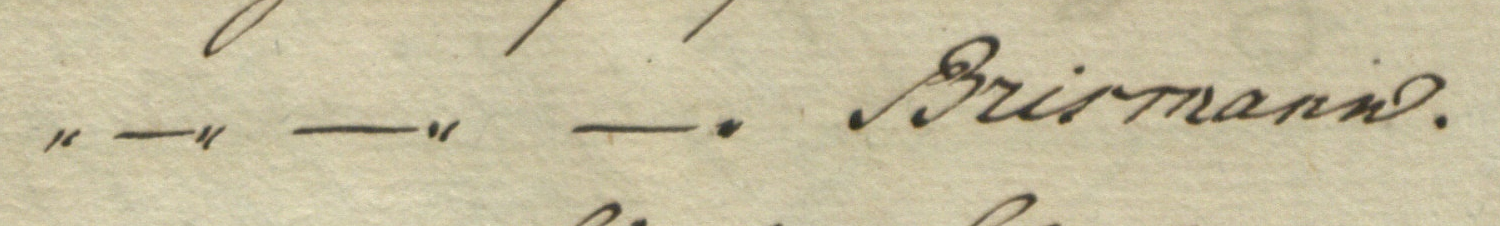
Brismann.
